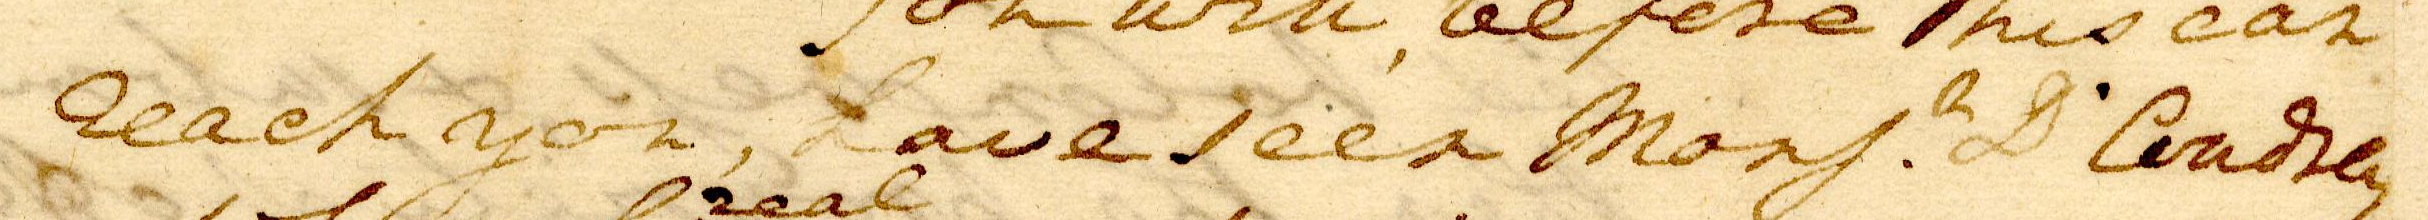reach you, have seen Mons. D'Coudrey
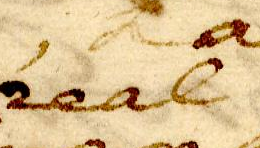real
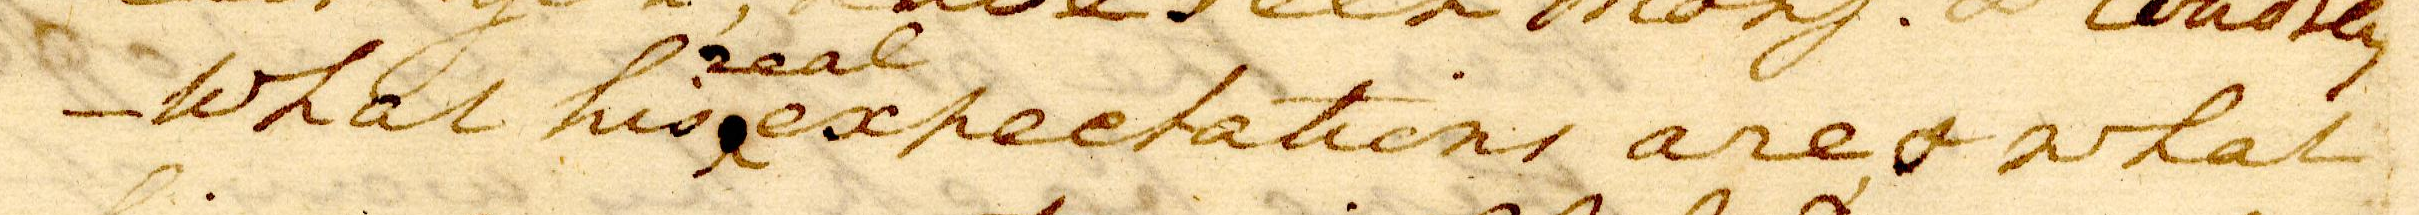- what his ^ expectations are & what
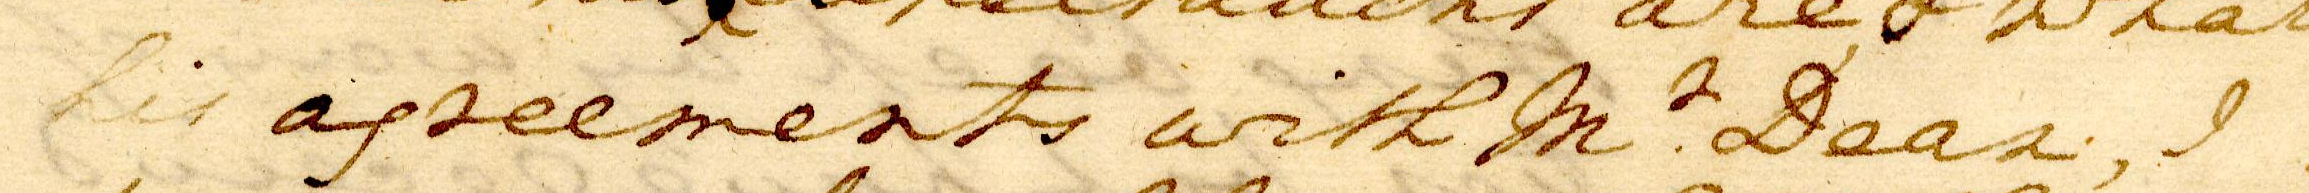his agreements with M^r. Dean, I
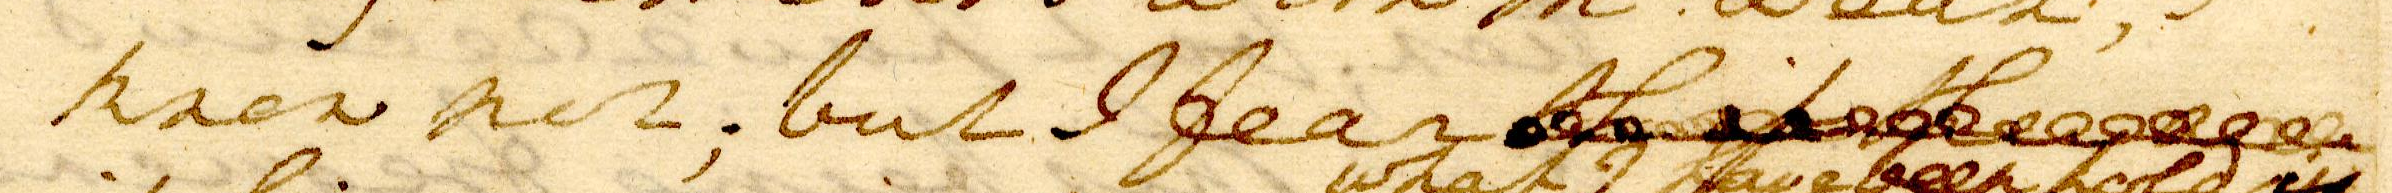know not but I fear [______________]
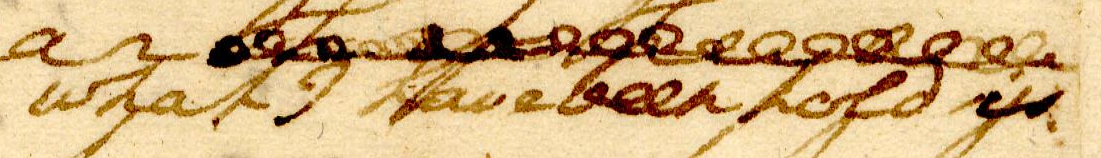what I have been told is
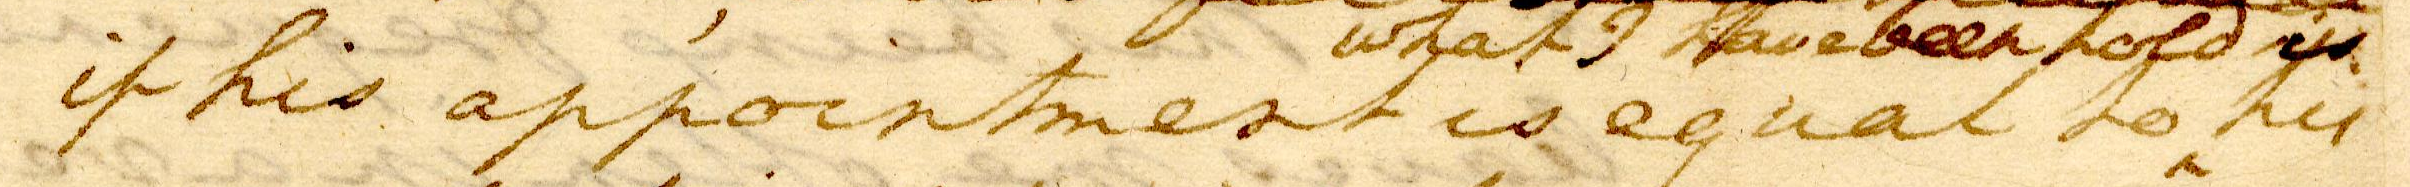if his appointment is equal to his
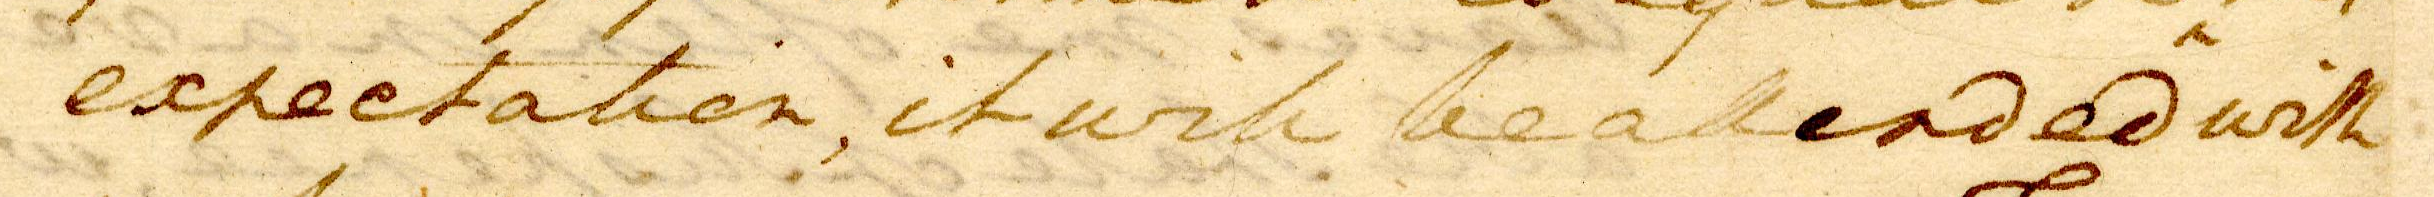expectation, it will be atended with
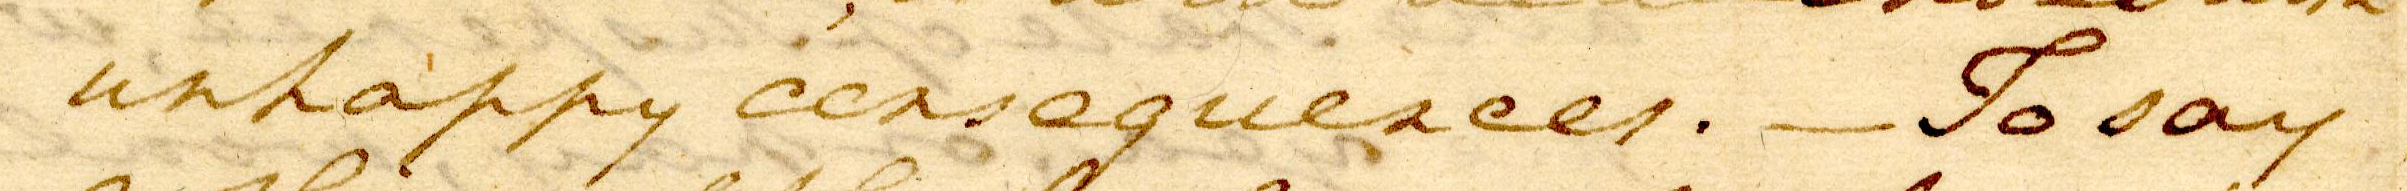unhappy consequences.- To say
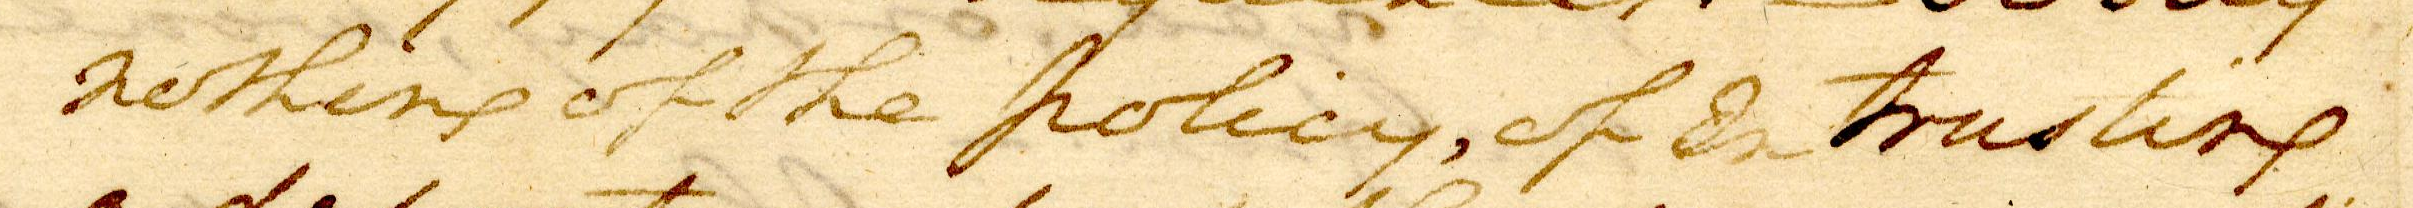nothing of the policy, of Entrusting
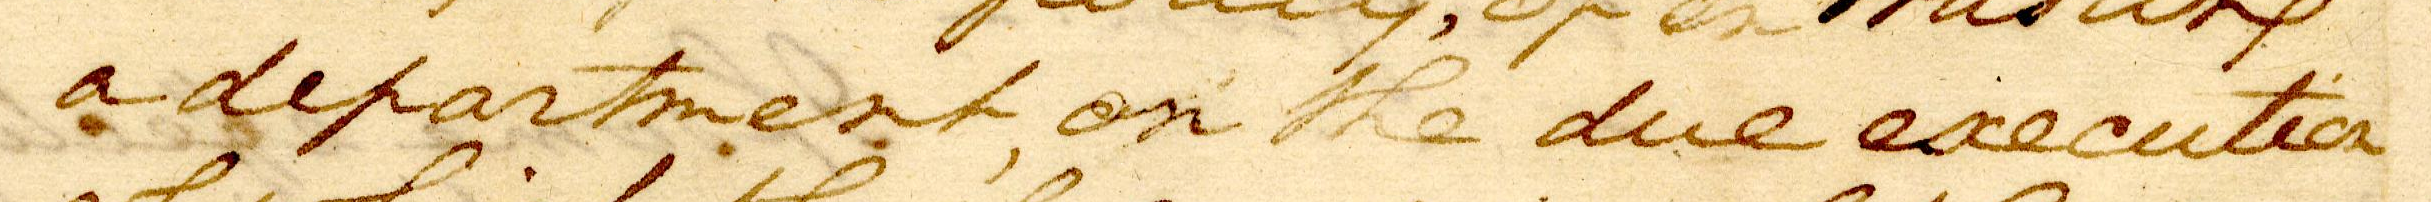a department on the due execution
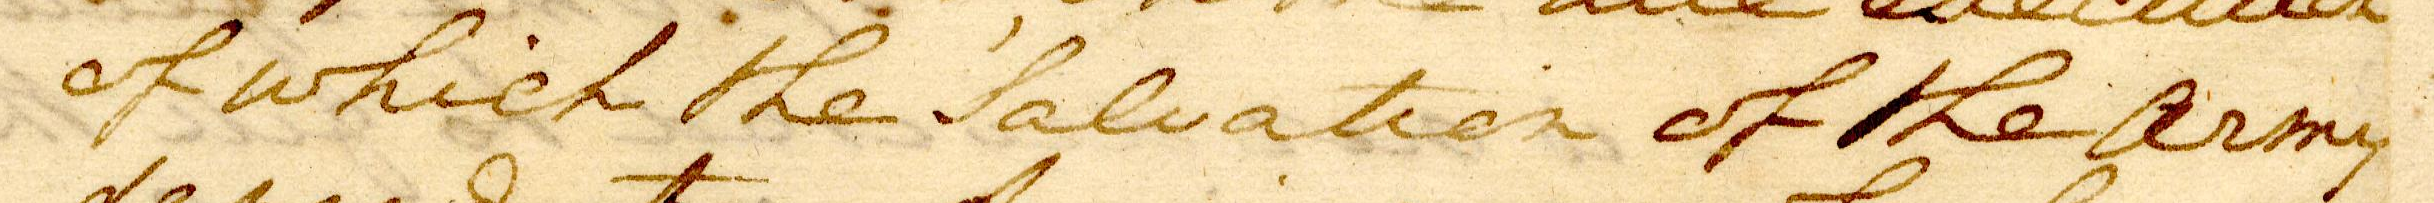of which the Salvation of the Army
